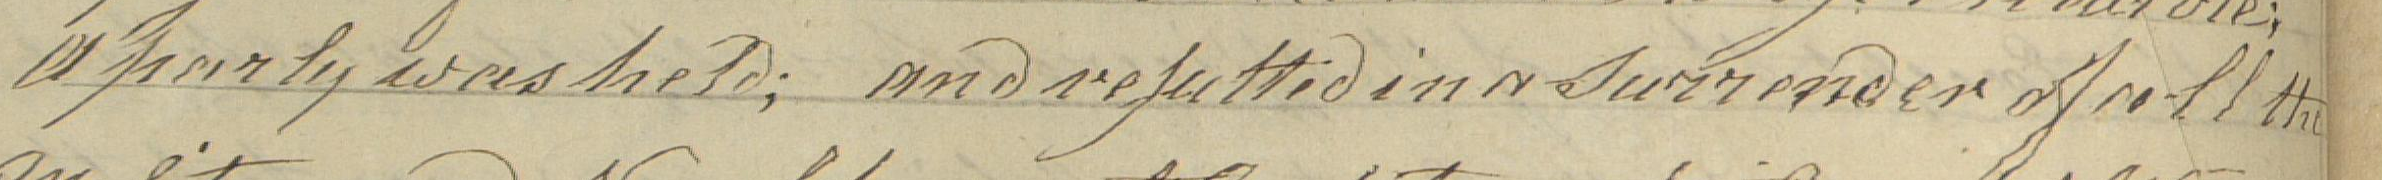A parly was held; and resulted in a Surrender of all the
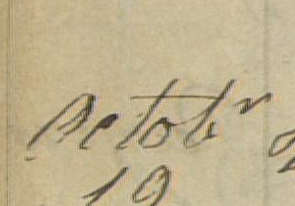Octob^r.
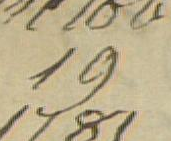19
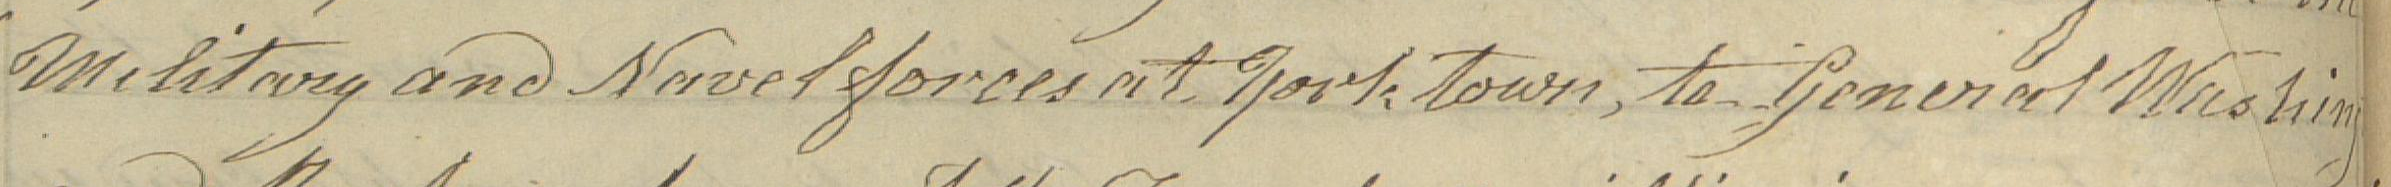Military and Navel forces at York town, to General Washing-
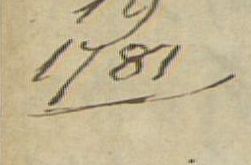1781
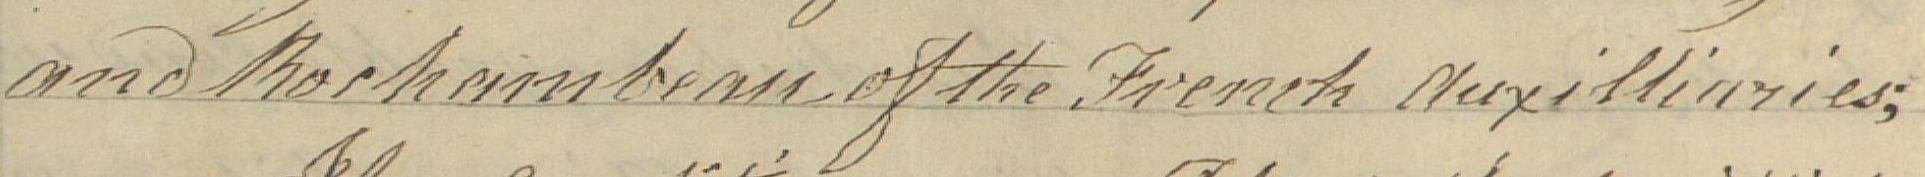and Rochambeau of the French Auxilliaries;
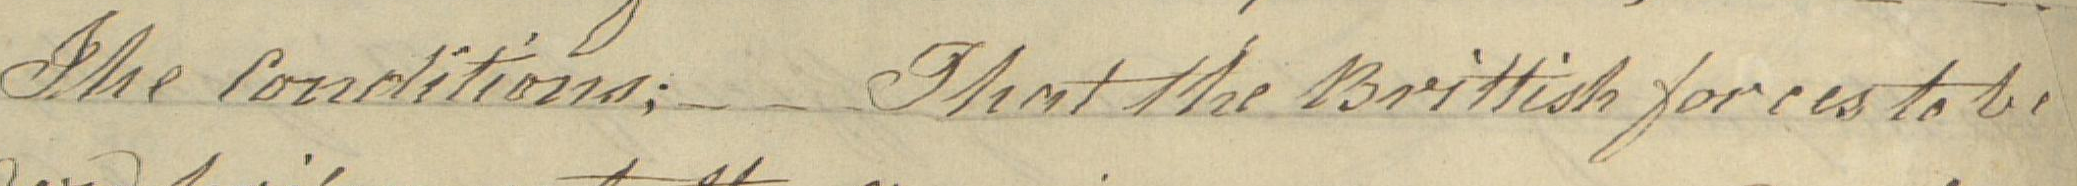The conditions; That the Brittish forces to be
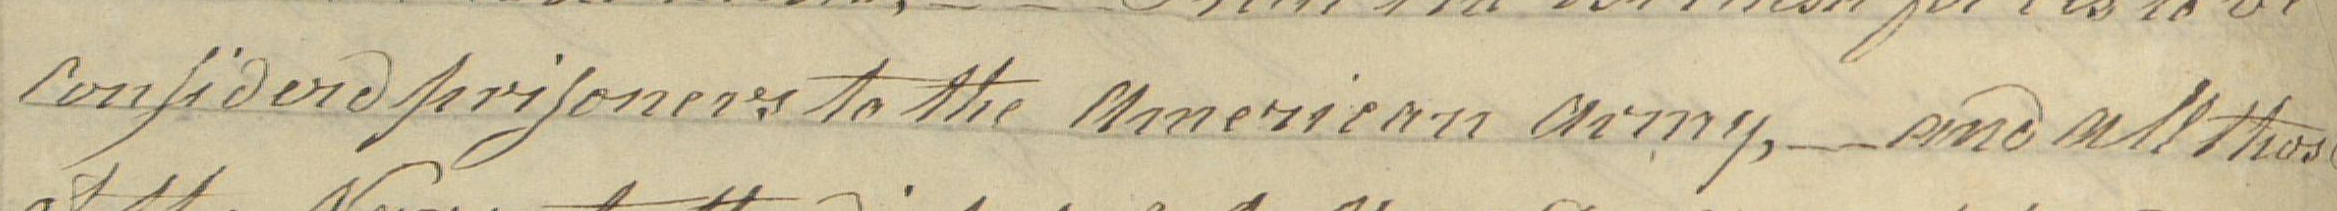considerd prisoners to the American Army, and all those
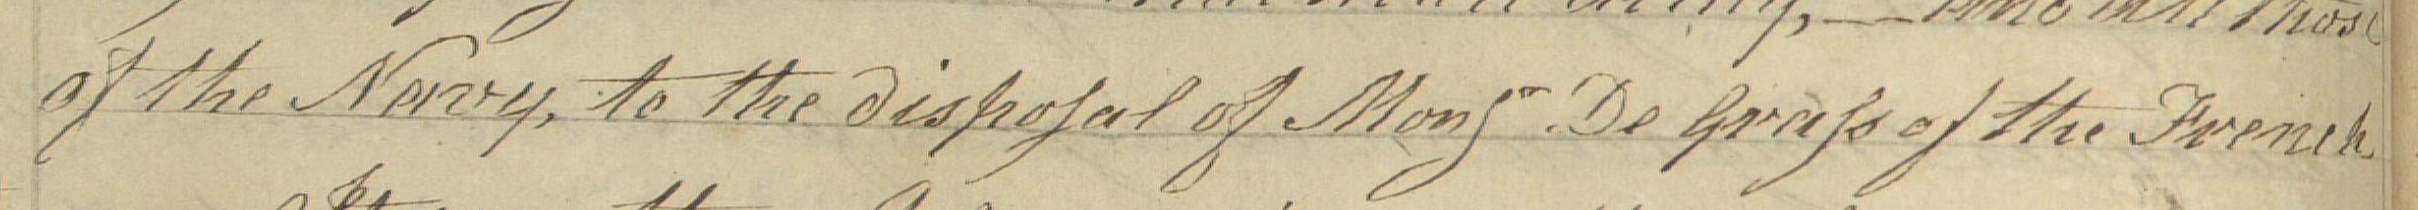of the Navy to the disposal of Mons^r. De Grasse of the French
